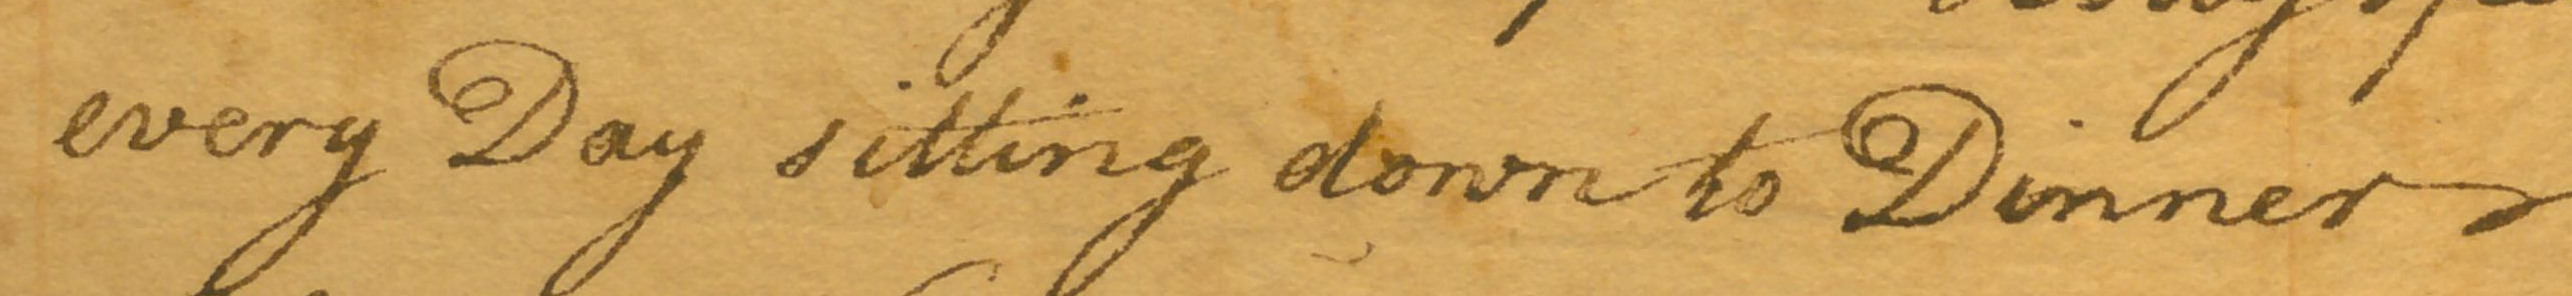every Day sitting down to Dinner
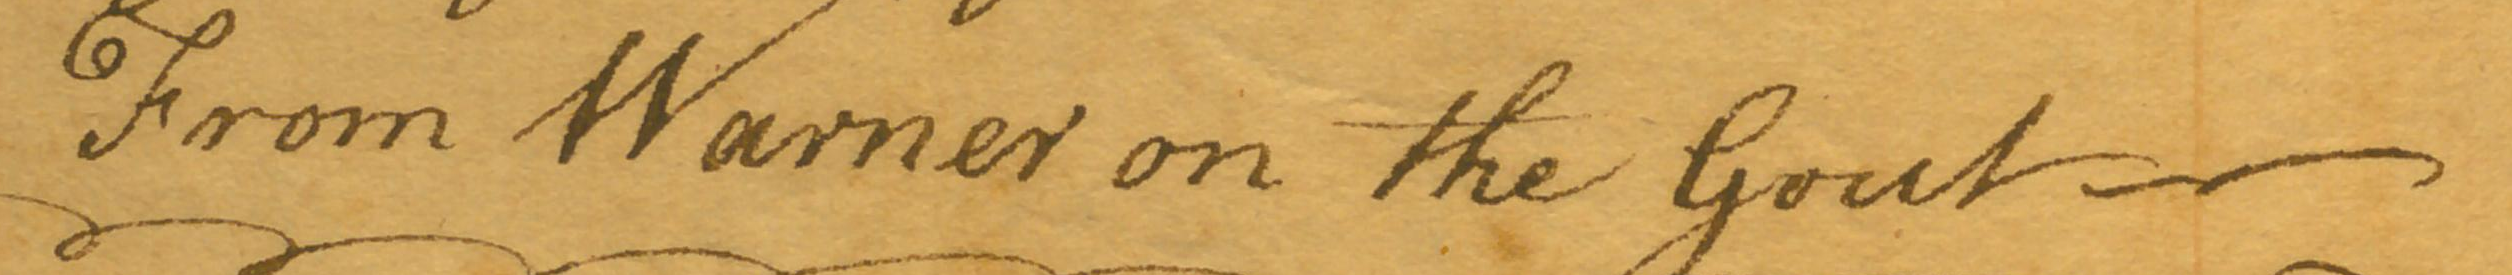From Warner on the Gout-
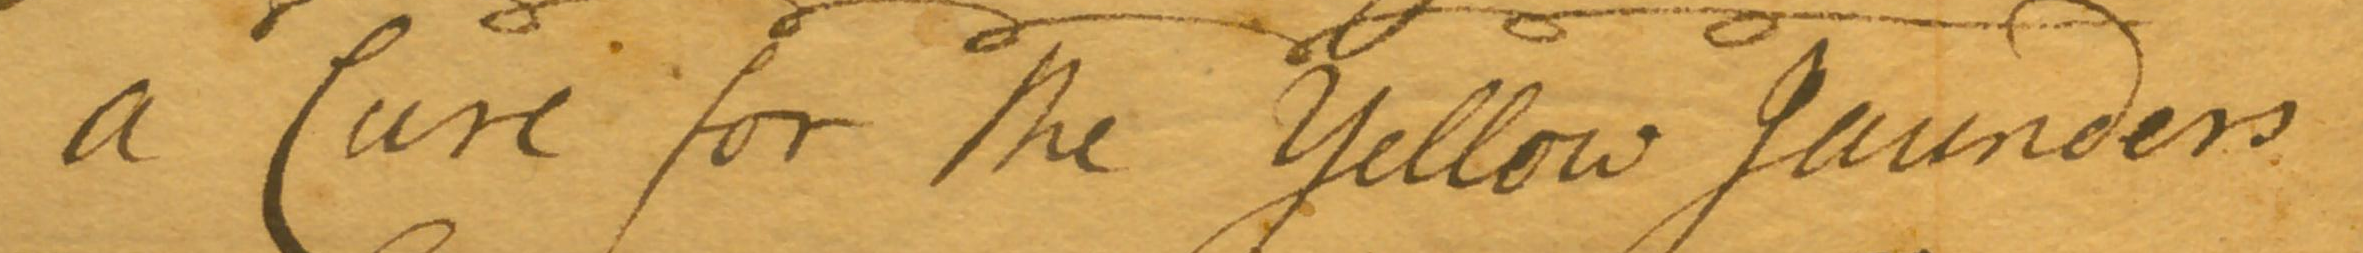a Cure for the Yellow Jaunders
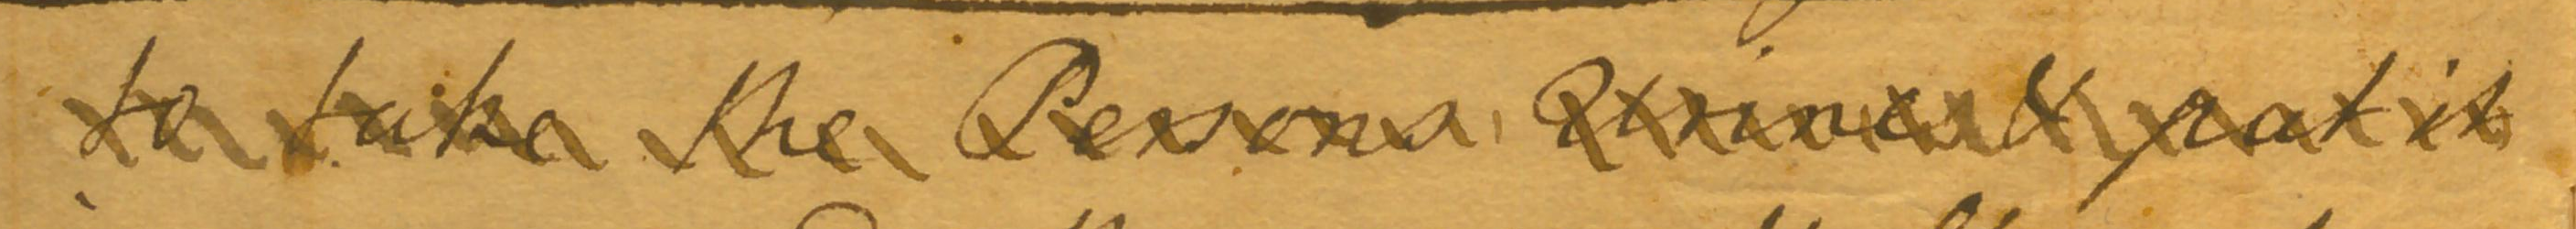to take the Persons Urine & put it
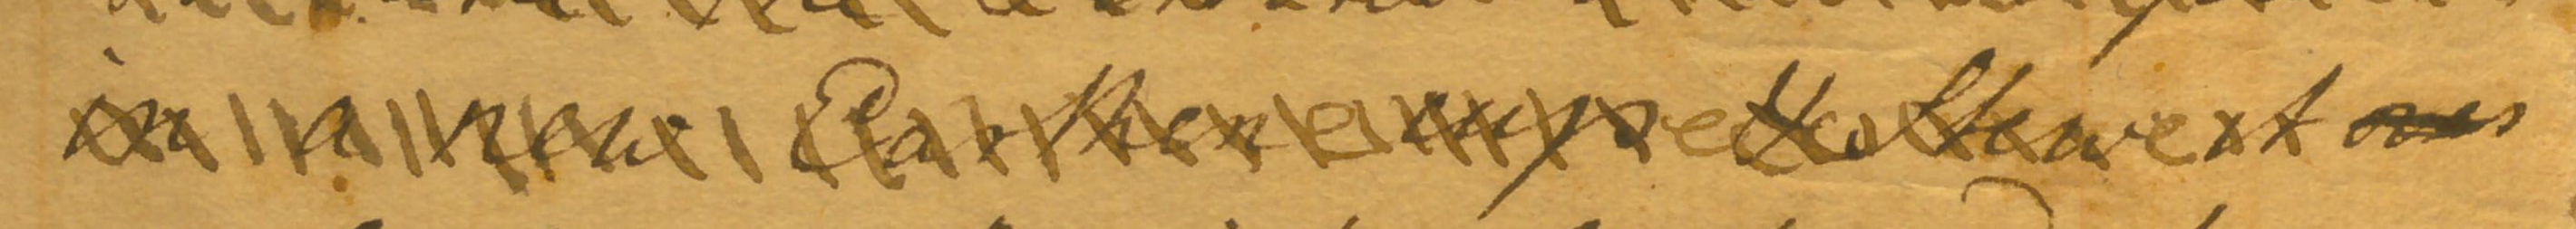in a new Earthen cup & stew it [over]
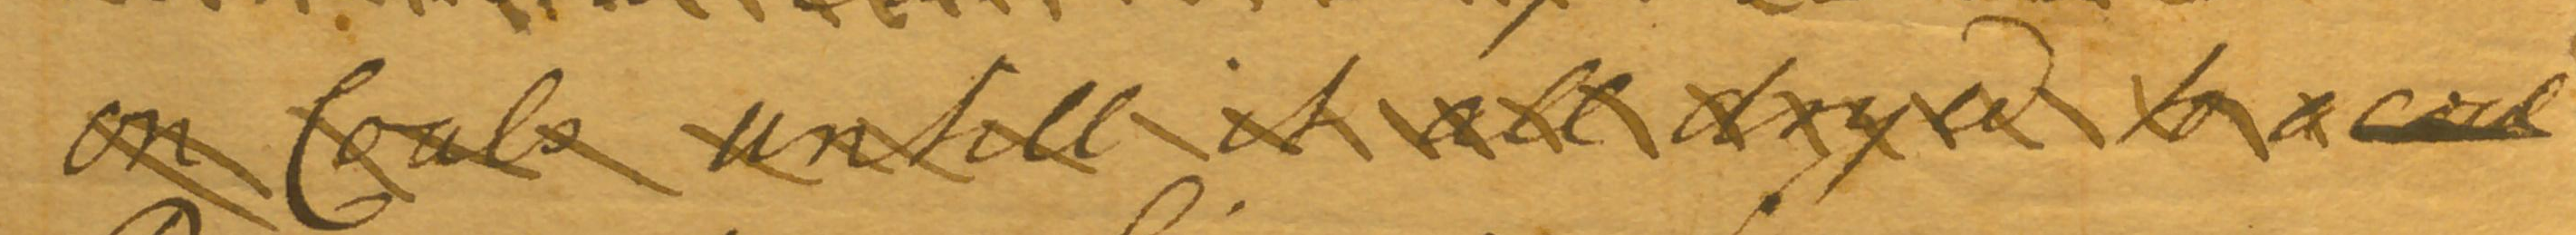on Coals untill it all dryed to a [____]
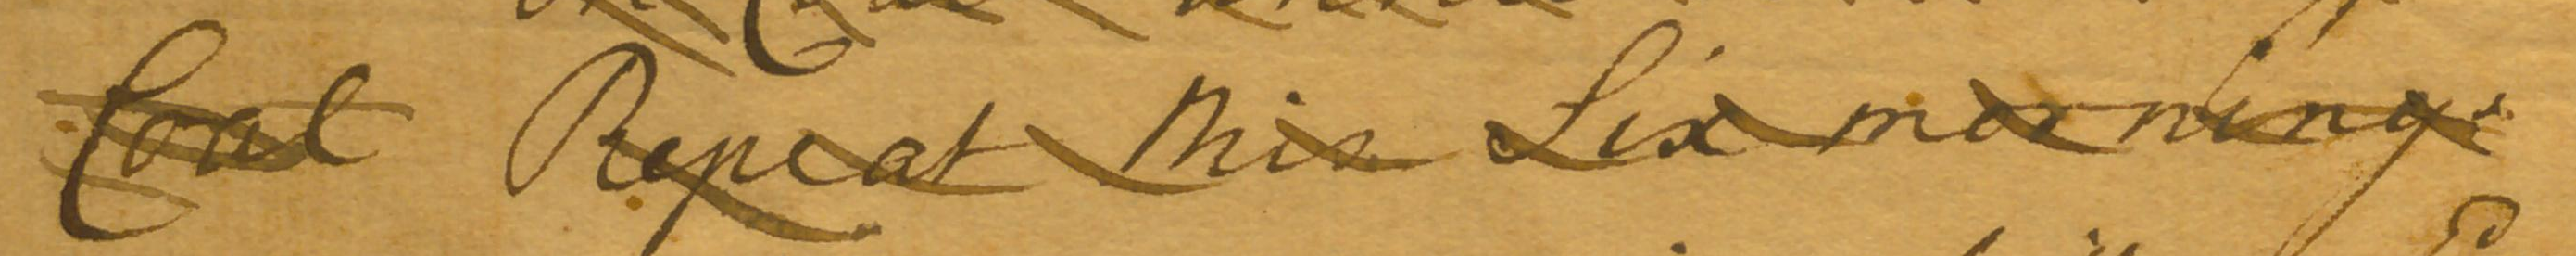Coal Repeat this six mornings
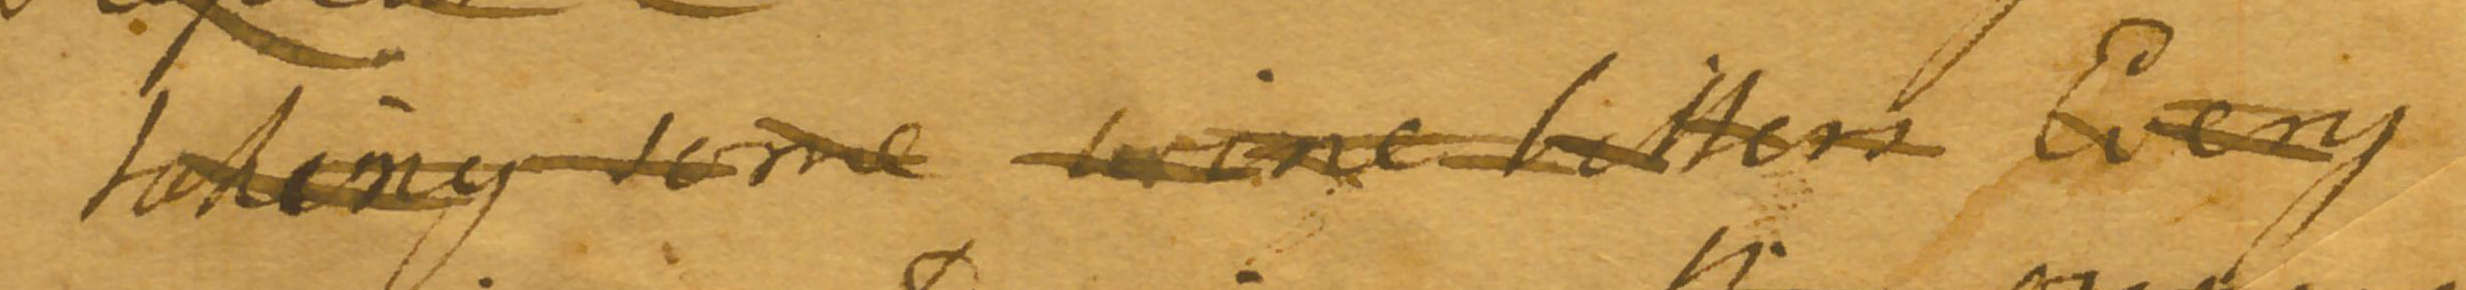taking some urine bitters Every
